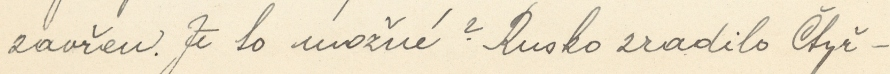zavřen. Je to možné? Rusko zradilo Čtyř-
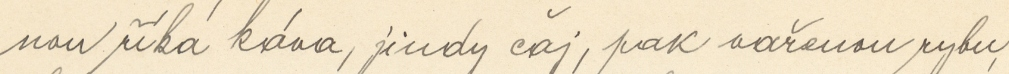nou říká káva, jindy čaj, pak vařenou rybu,
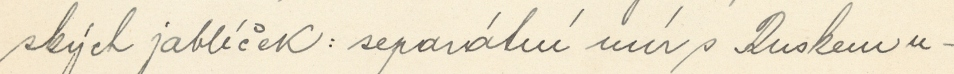ských jablíček: separátní mír s Ruskem u-
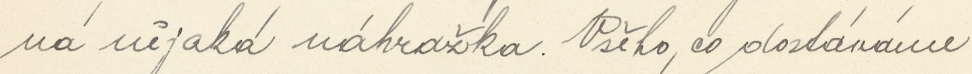ná nějaká náhražka. Všeho, co dostáváme
